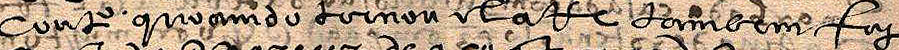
couto quoamdo tornou ela Re tambem foy
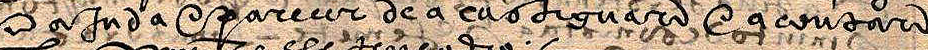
ē aJuda e parecer de a castiguarē e acoutarē
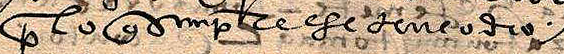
p̄lo q̄ sempre lhe teue odio ./
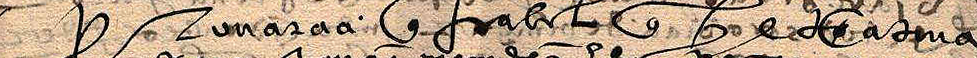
Ꝓrouaraa q̄ Jsabel q̄ he tCatiua
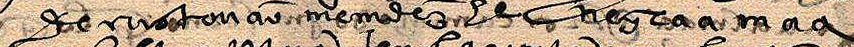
de cristouaõ memdez he negraa maa
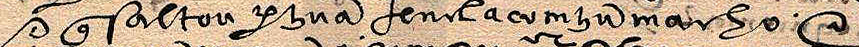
e q̄ saltou ꝑ huā Jenela com hū macho e
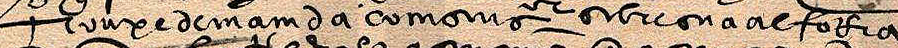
trouxe demamda com seu sor sobre sua alfoRia
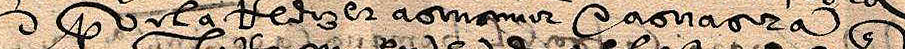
e p̄o ela Re dizer a seu snnōr e a sua sorā q̄
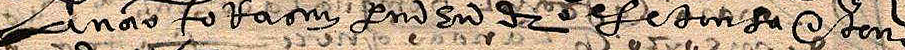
a não foRasem ꝑ nēhū dro lhe tinha e tem
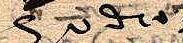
hodio
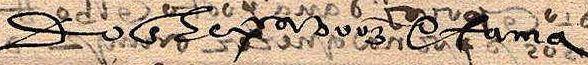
Do q̄ he pca vooz e fama
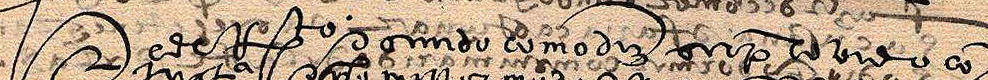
Pede Rꝭto e semdo como diz ser provido cō
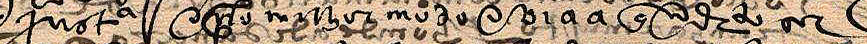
Justa e ꝑlo milhor modo e viaa q̄ ē drto ser
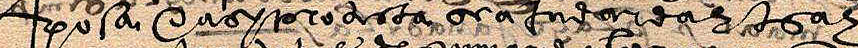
posa e asy protesta se aJudar das tsas
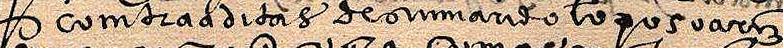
e comtraaditas de seu marido lopo soarez
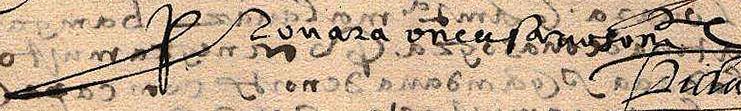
ꝓrouara o necesario somte
